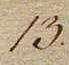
13.
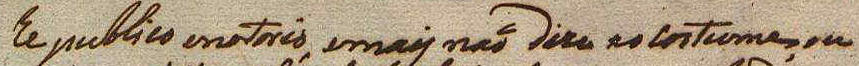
he publico e notorio, e mais naõ dice ao costume, ou
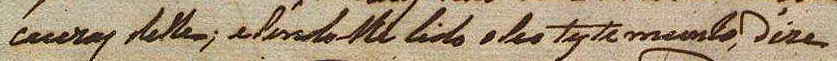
cauzas delle; e sendo-lhe lido o seo testemunho, dize
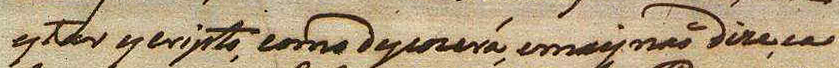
estar escripto, como depozerá, e mais naõ dize, e a
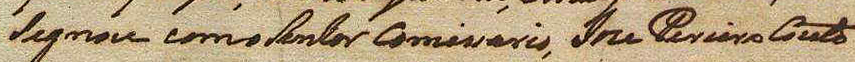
segnou com o senhor Comissario, Ioze Pereiro Couto
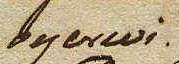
o escrevi.
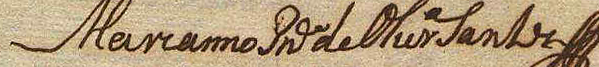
Mareanno In.a de Oliur.a Santoz
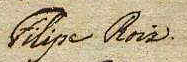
Filipe Roiz̄.
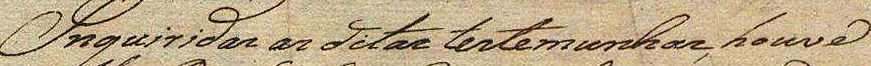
Inquiridaz az ditaz testemunhaz, houve
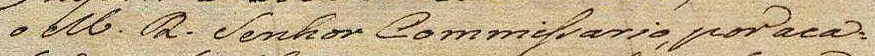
o M. R. Senhor Commissario, por aca
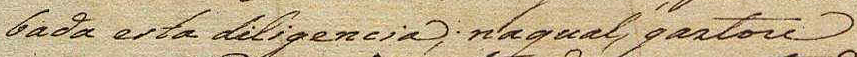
bada esta diligencia, na qual gaztou
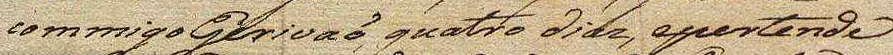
commigo Escrivaõ quatro diaz, e pertende
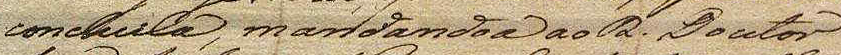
concluila, mandandoa ao R. Doutor
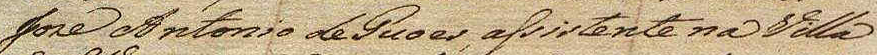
Joze Antonio de Guoes, assistente na Villa
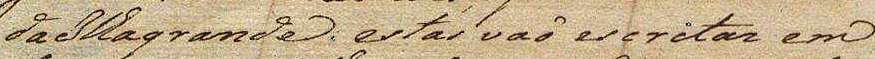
da Ilha grande. estas vaõ escritaz em
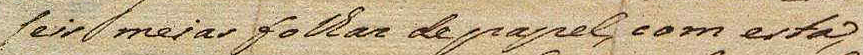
seis meias folhaz de papel, com esta,
